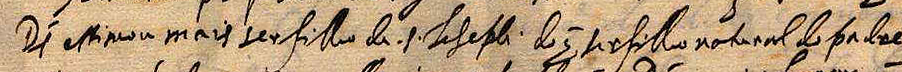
Ds̄ estimou mais ser filho de s. Ioseph do q̄ ser filho natural do padre
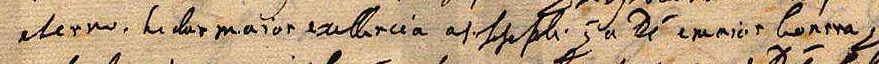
eterno. he dar maior exellencia a s. Ioseph q̄ a Ds̄ e maior honrra q̄
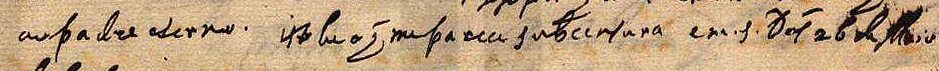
ao padre eterno. isto he o q̄ me para sub censura em .s. Dos̄ 26 de Maio
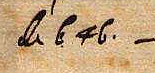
de 646. -
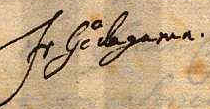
fr Gco da gama.
